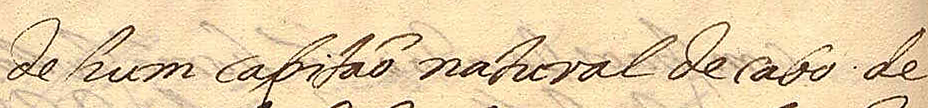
de hum capitaõ natural de cabo de
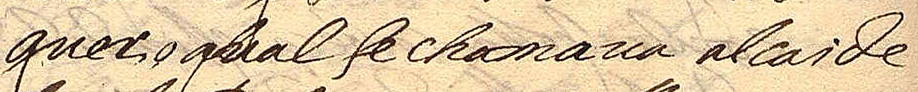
guer o qual se chamaua alcaide
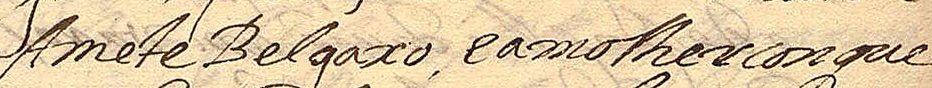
Amete Belgaxo. E a molher con que
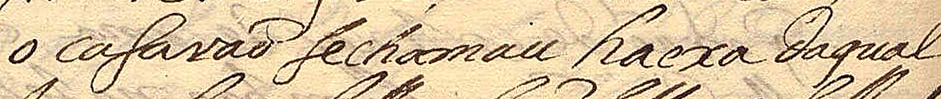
o casaraõ se chamou haexa da qual
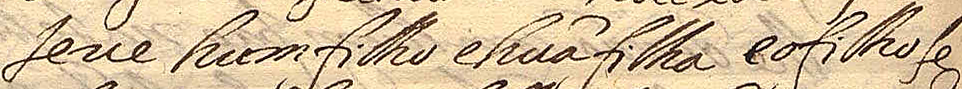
teue hum filho e huā filha e o filho se
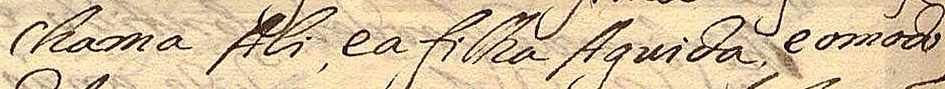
chama Ali, e a filha Aguida, e o modo
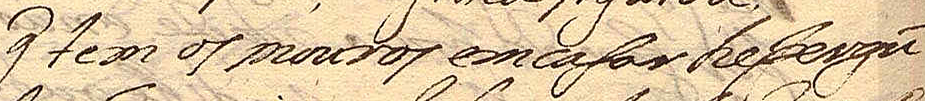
q̄ tem os mouros em casar he pergū
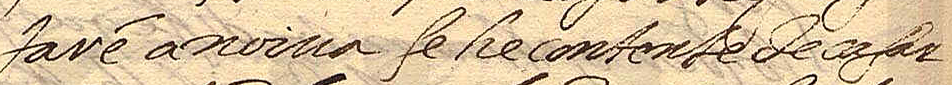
tarē a noiua se he contente de casar
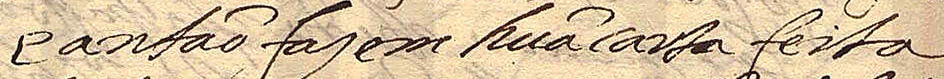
E antaõ fazem huā carta feita
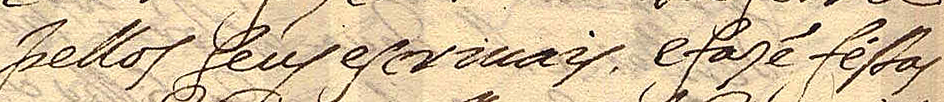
pellos seus escriuais, e fazē festas
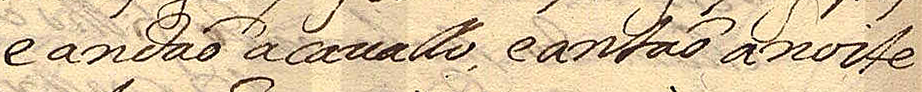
e andaõ a cauallo, e antaõ a noite
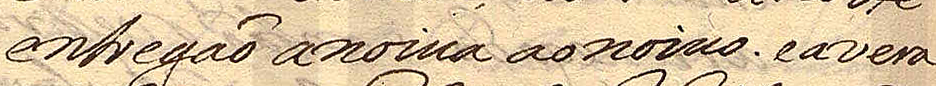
entregaõ a noiua ao noiuo. e avera
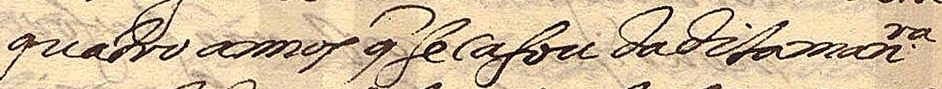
quatro annos q̄ se casou da dita man.ra
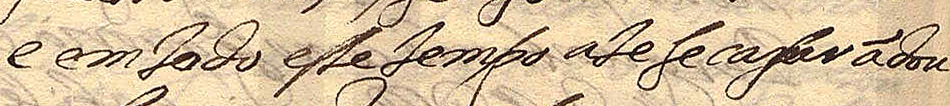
e em todo este tempo ate se casar ādou
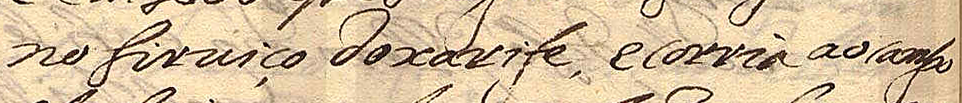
no siruiço do xarife, e corria ao campo
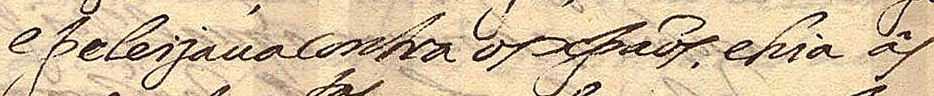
e peleijaua contra os xpaõs, e hia âs
